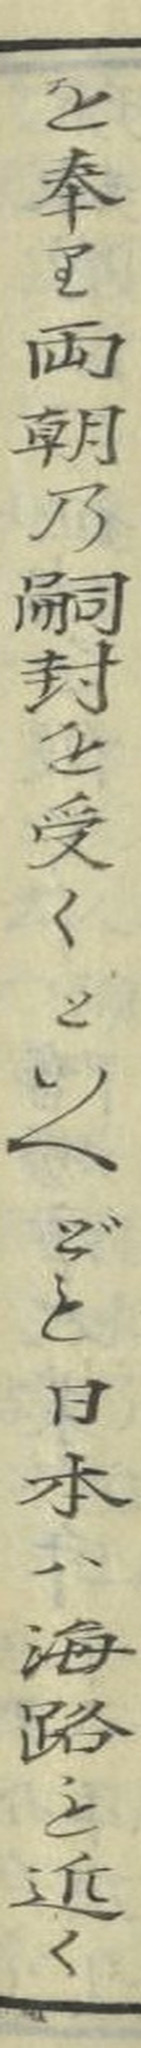を奉り両朝の嗣封を受くといへども日本は海路も近く
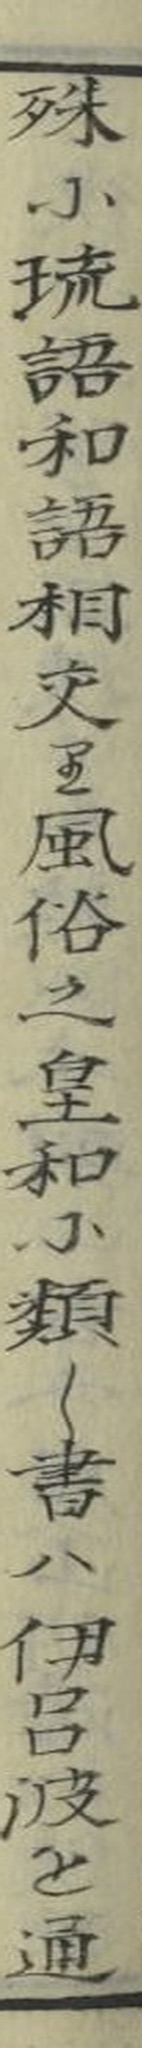殊に琉語和語相交り風俗之皇和に類し書は伊呂波を通
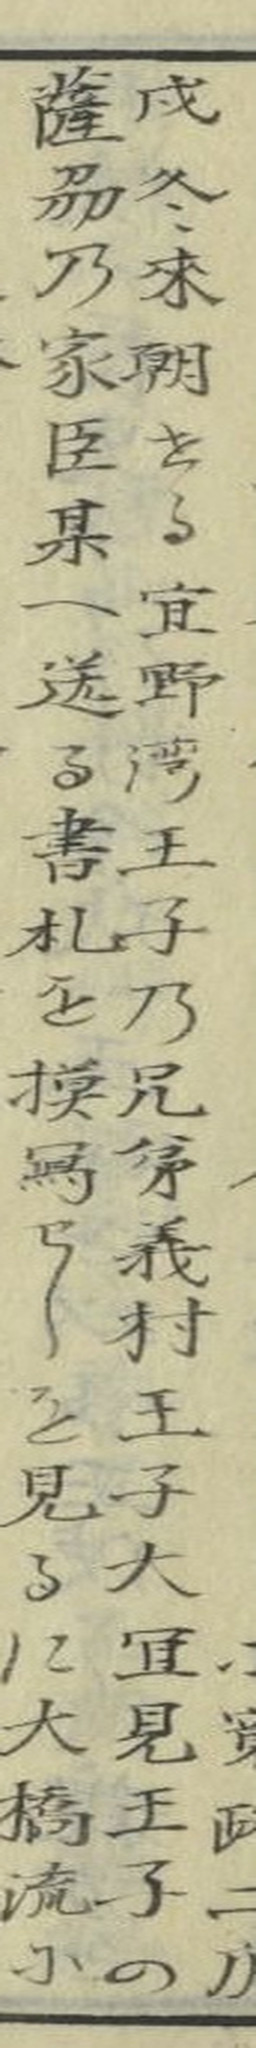薩州の家臣某へ送る書札を摸写せしを見るに大橋流に
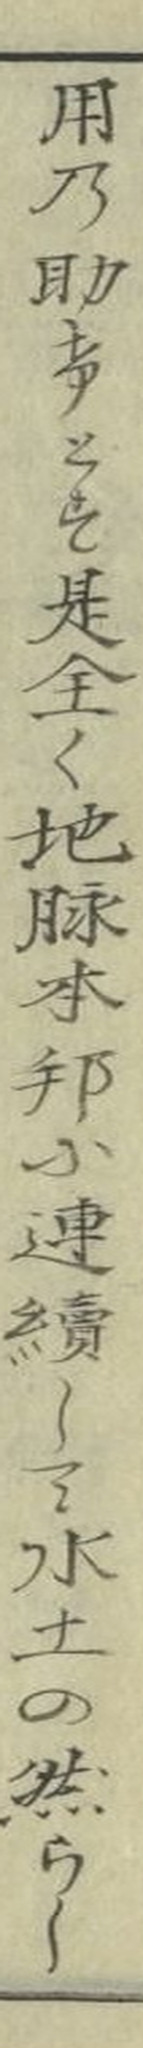用の助けとす是全く地脈本邦に連続して水土の然らし
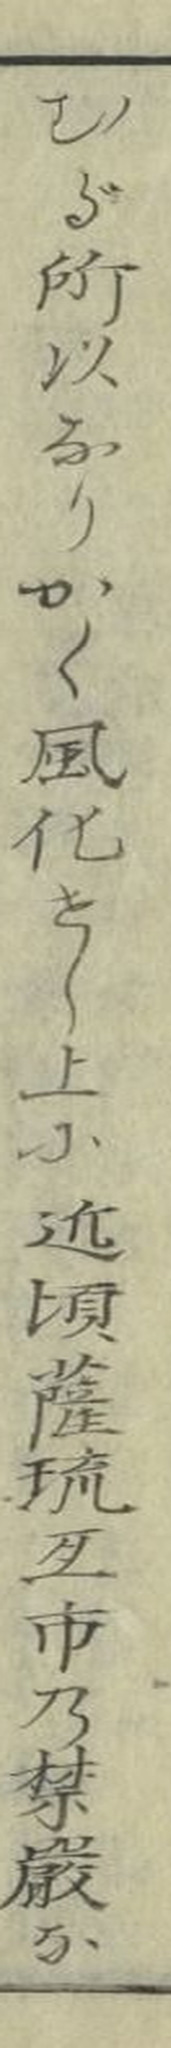むが所以なりかく風化せし上に近頃薩琉互市の禁厳な
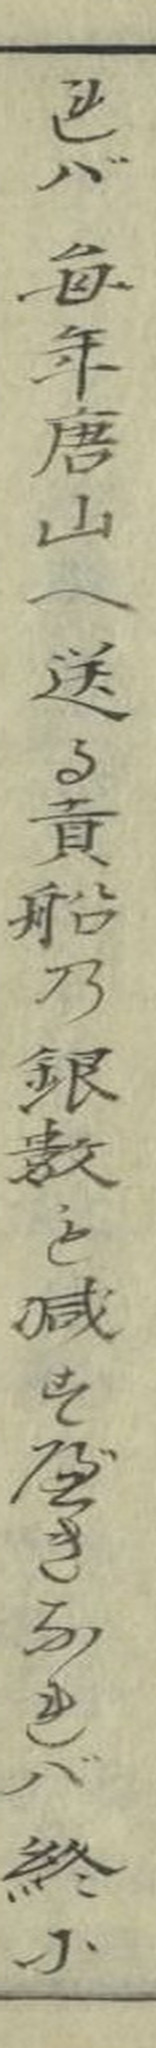れば毎年唐山へ送る貢船の銀数も減すべきなれば終に
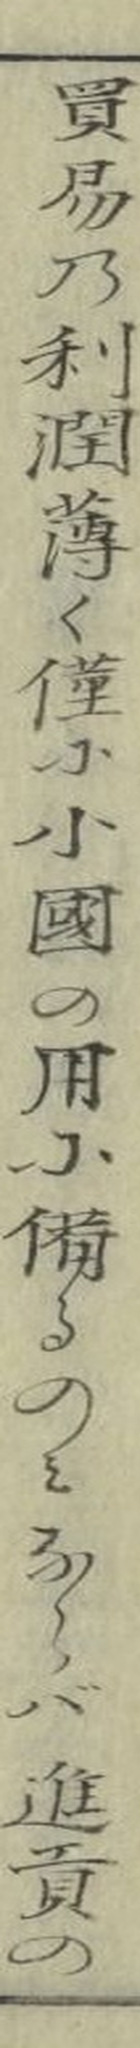買易の利潤薄く僅に小国の用に備るのみなれば進貢の
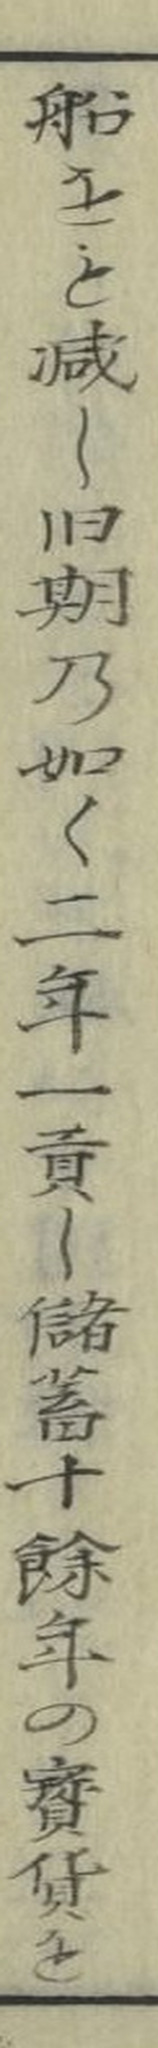船をも減し旧期の如く二年一貢し儲蓋十餘年の宝貨を

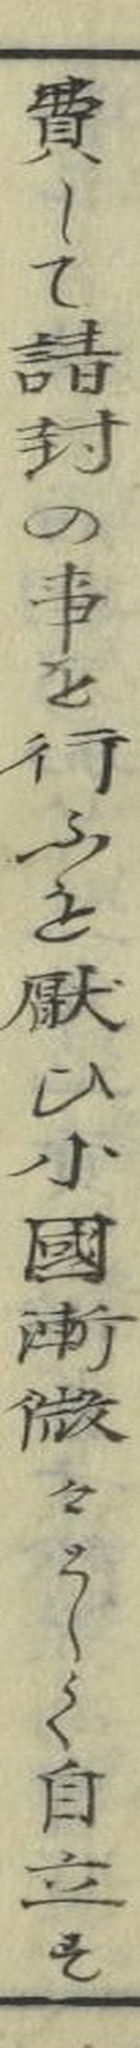費して請封の事を行ふを厭ひ小国漸微々として自立す
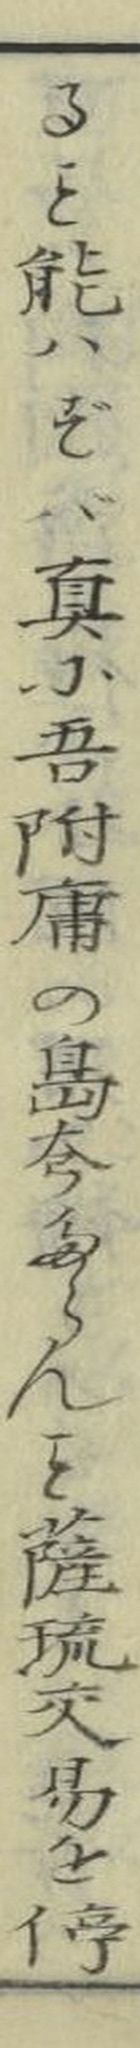ること能はずば真に吾附庸の島夸たらんこと薩琉交易を停
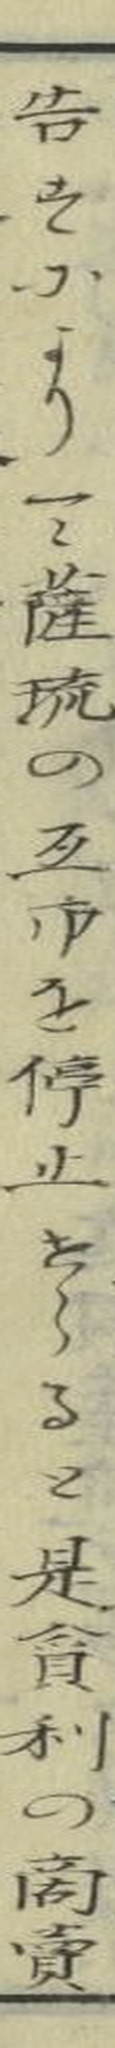告すにより一々薩琉の互市を停止せらると是貪利の商売
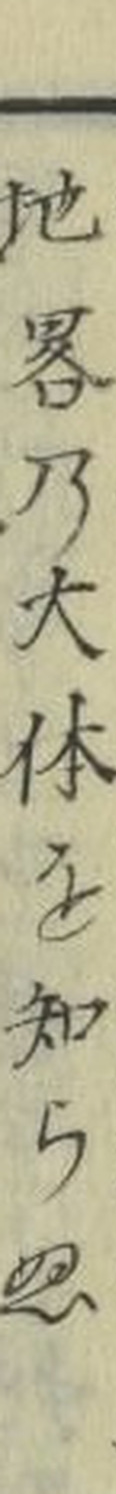地略の大体を知らぬ
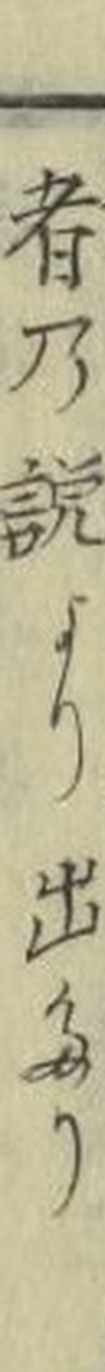者の説より出たり
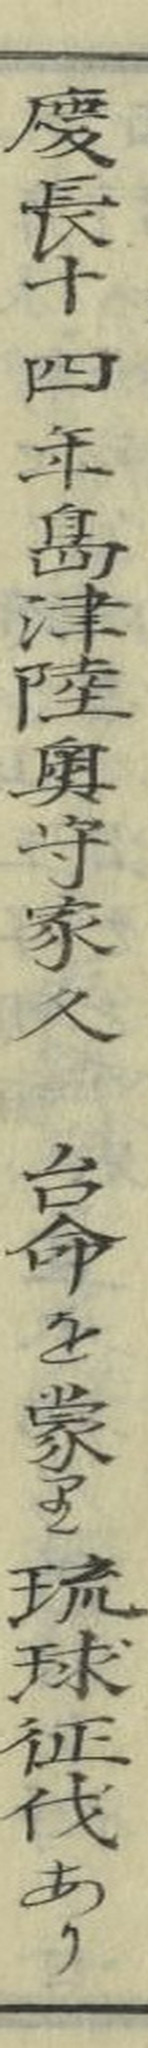慶長十四年島津陸奥守家久台命を蒙り琉球征伐あり
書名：琉球沿革志 下
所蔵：University of the Ryukyus Library
